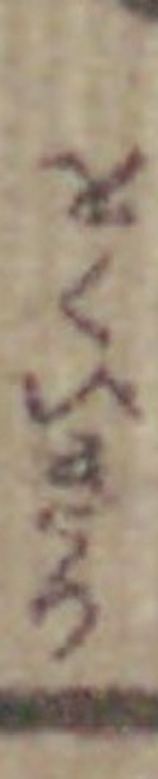をくいきり

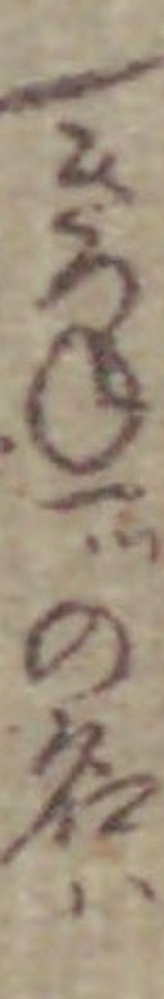きつね一つの名は
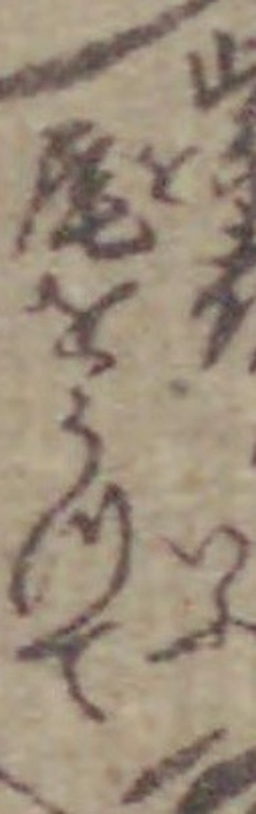尾をうつて
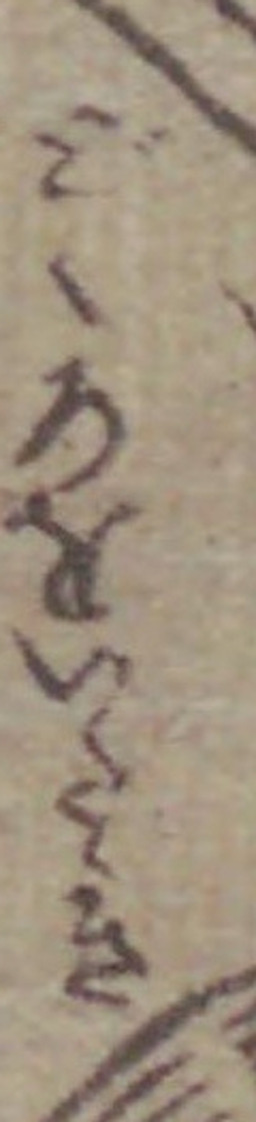どくろをいたゝき
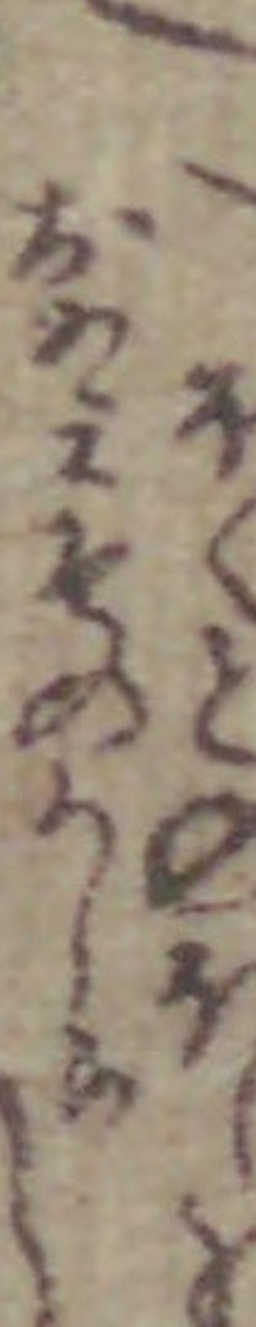おかみそのかしら
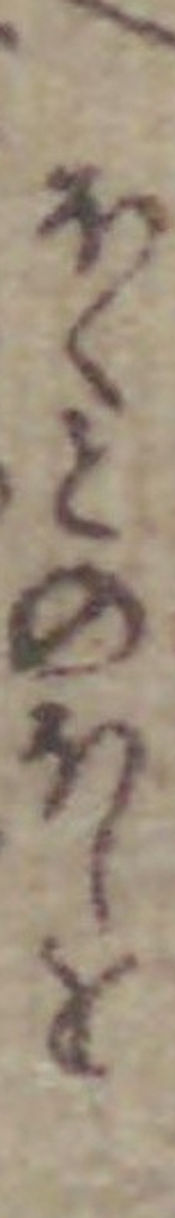ほくとのほしを
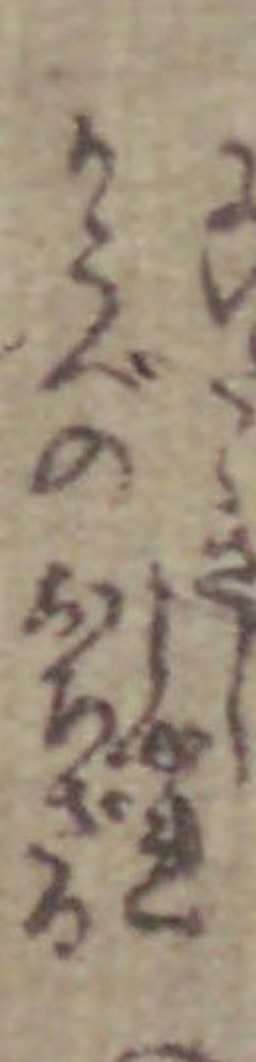かうべのおちざる
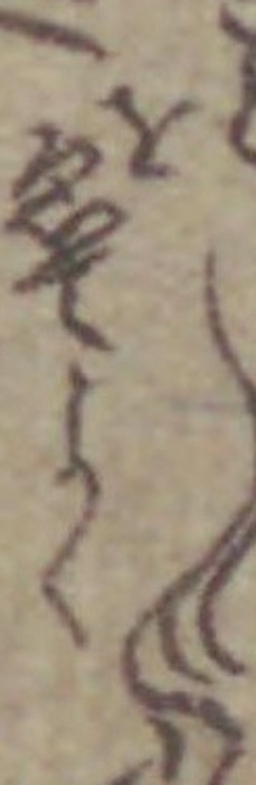ゑてよく
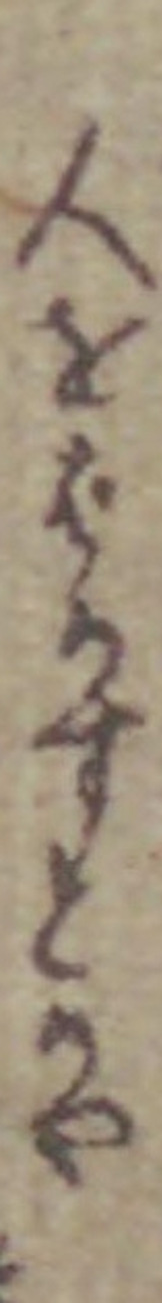人をばかすとかや
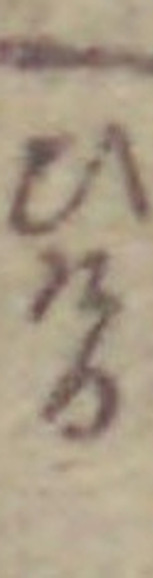ひける

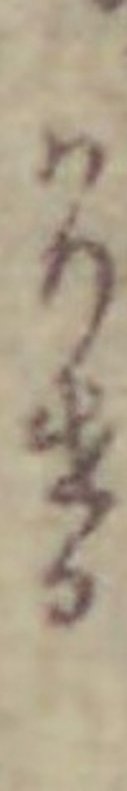かりける
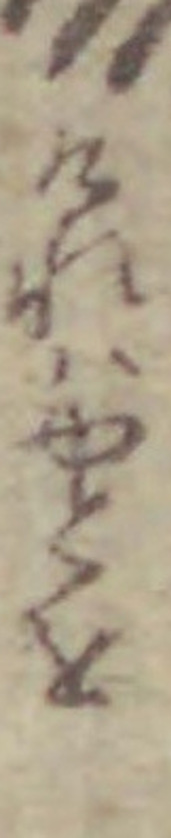けれはやとを
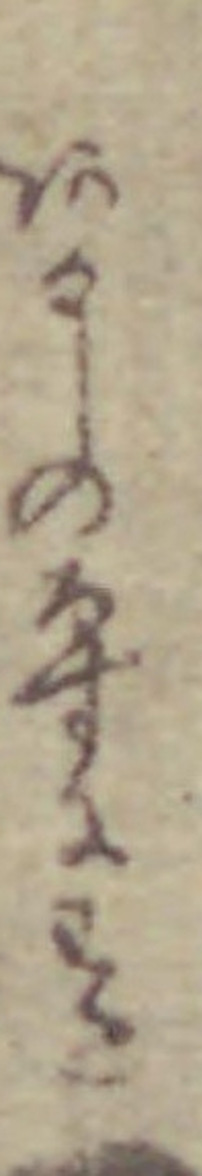あるしのるすにわた
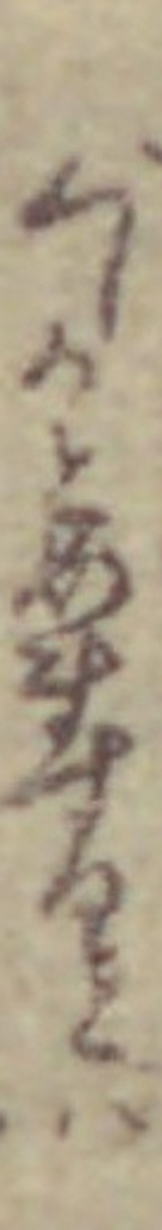くしかとめますることは
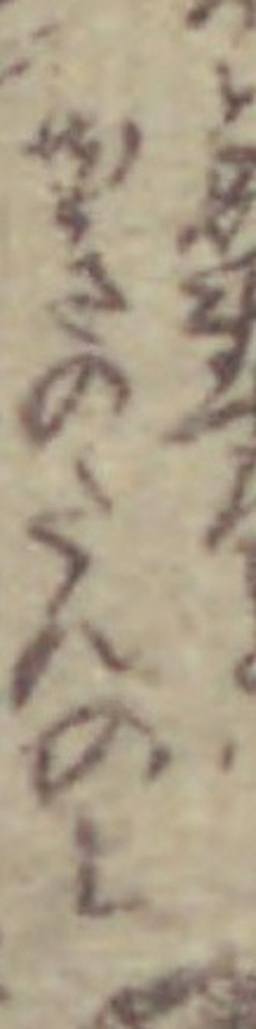ゆきのたんの上
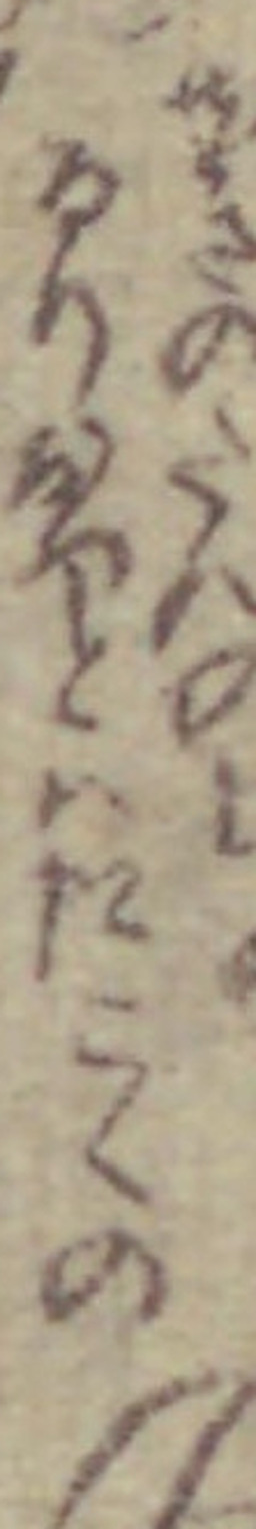るりおつとはたこくの
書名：化物一家髭女 2巻
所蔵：国立国会図書館 National Diet Library, JAPAN
